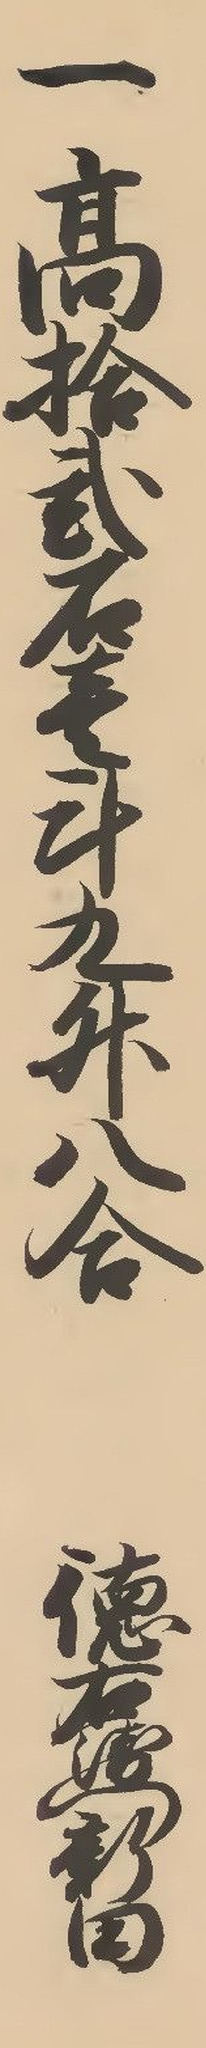一高拾弐石壱斗九升八合徳右衛門新田
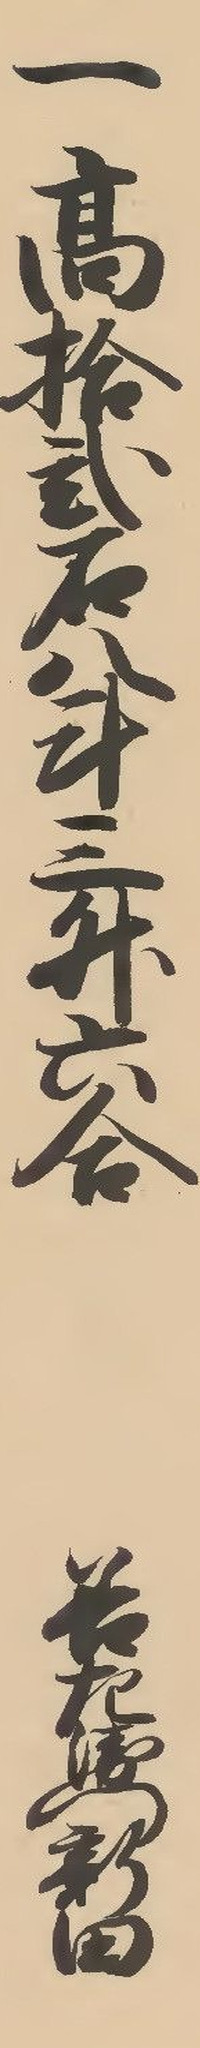一高拾弐石八斗三升六合善左衛門新田
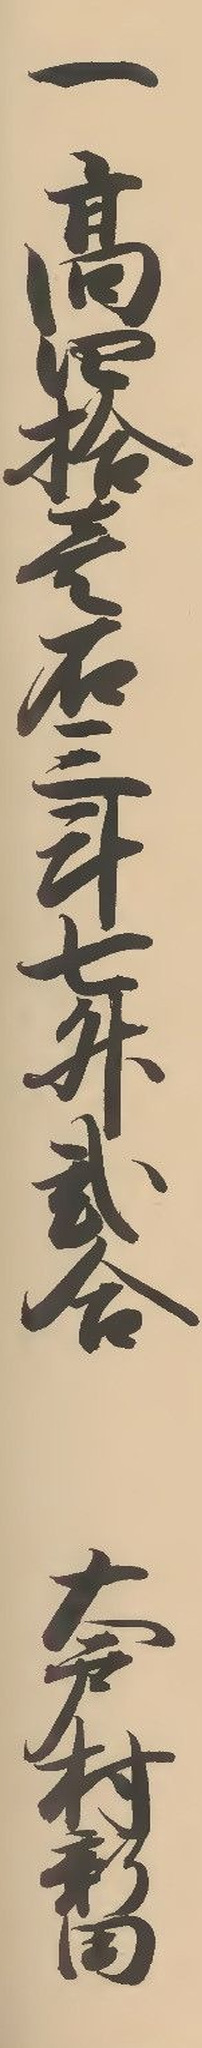一高四拾壱石三斗七升弐合大戸村新田
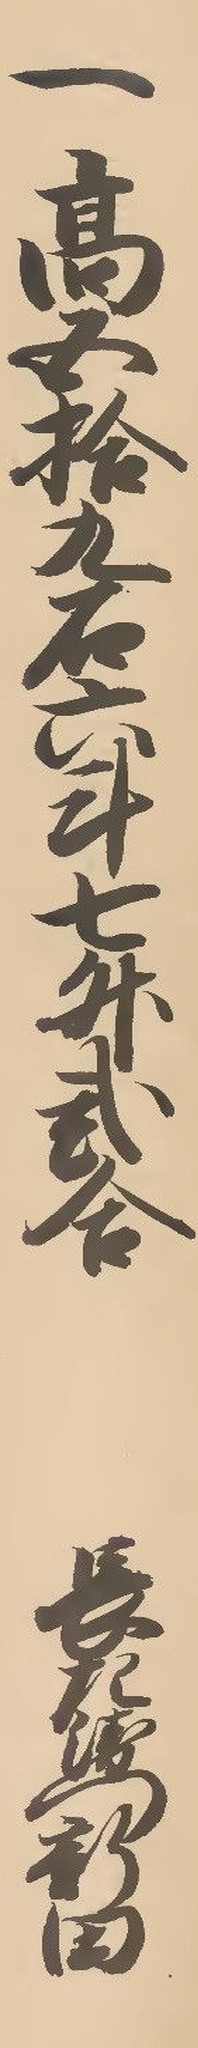一高五拾九石六斗七升弐合長左衛門新田
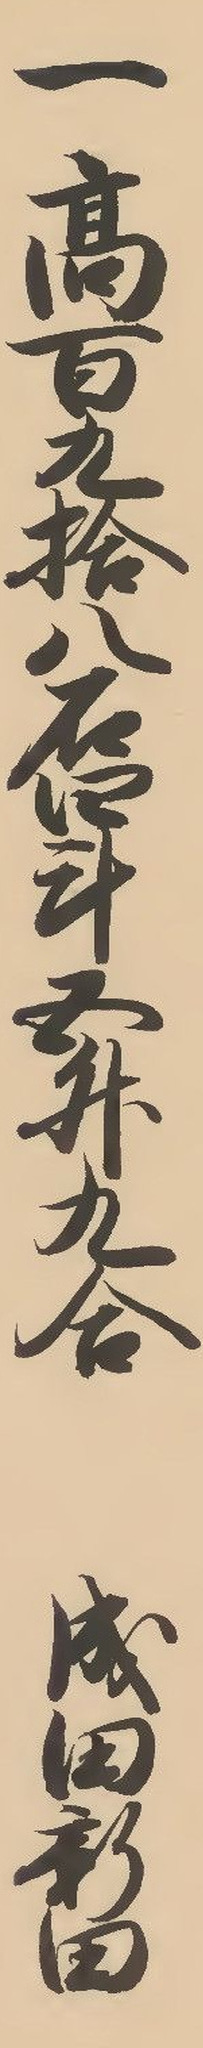一高百九拾八石四斗五升九合成田新田
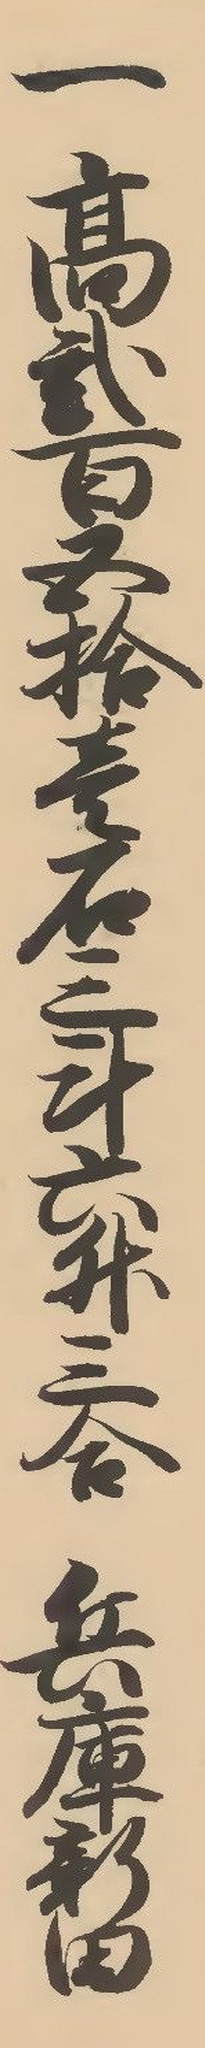一高弐百五拾壱石三斗六升三合兵庫新田
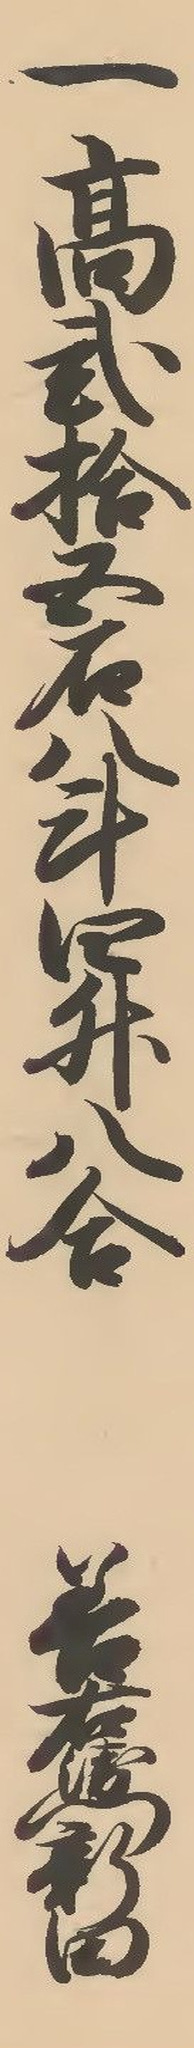一高弐拾五石八斗四升八合善右衛門新田

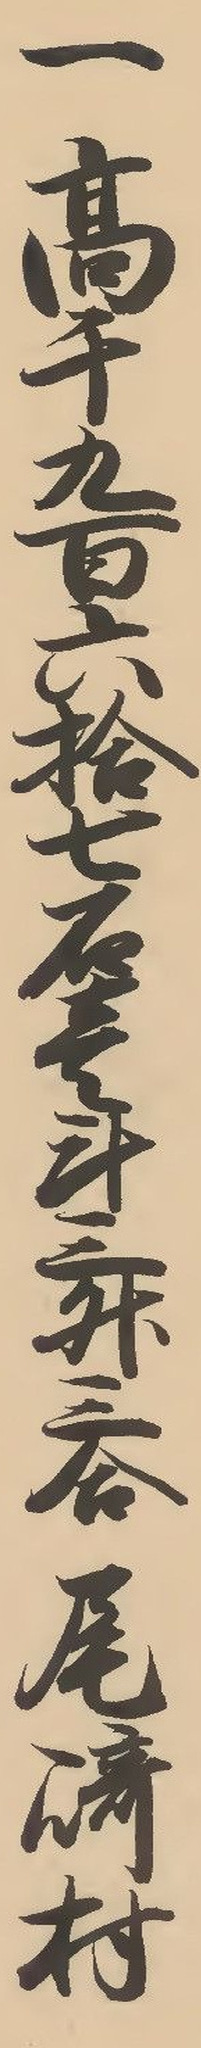一高千九百六拾七石壱斗三升三合尾崎村
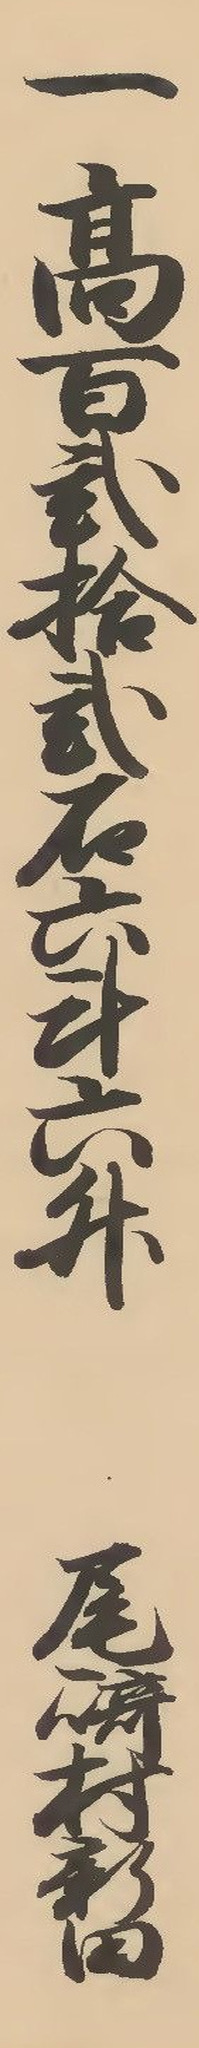一高百弐拾弐石六斗六升尾崎村新田
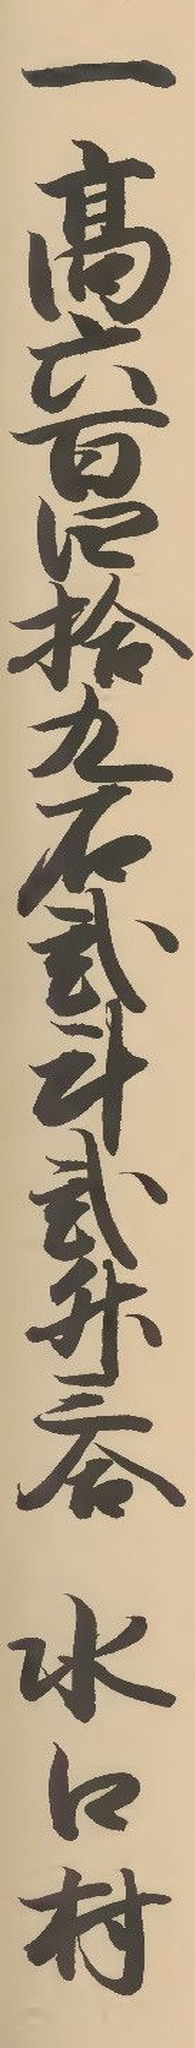一高六百四拾九石弐斗弐升三合水口村
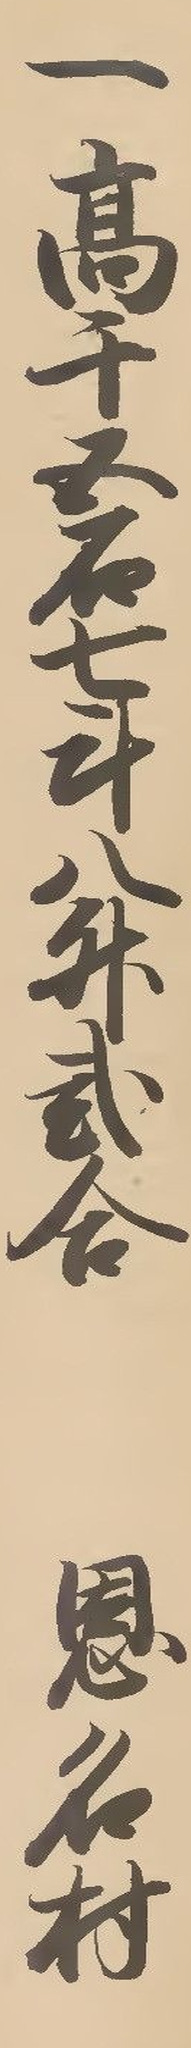一高千五石七斗八升弐合恩名村
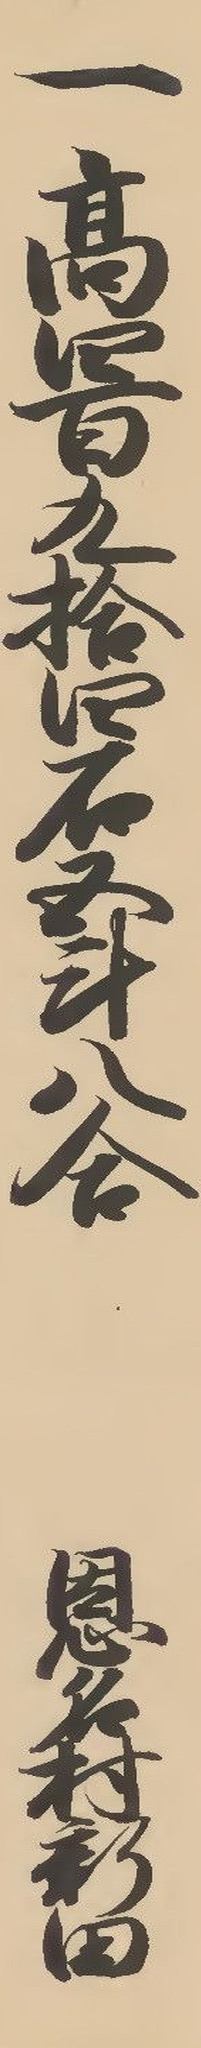一高四百九拾四石五斗八合恩名村新田
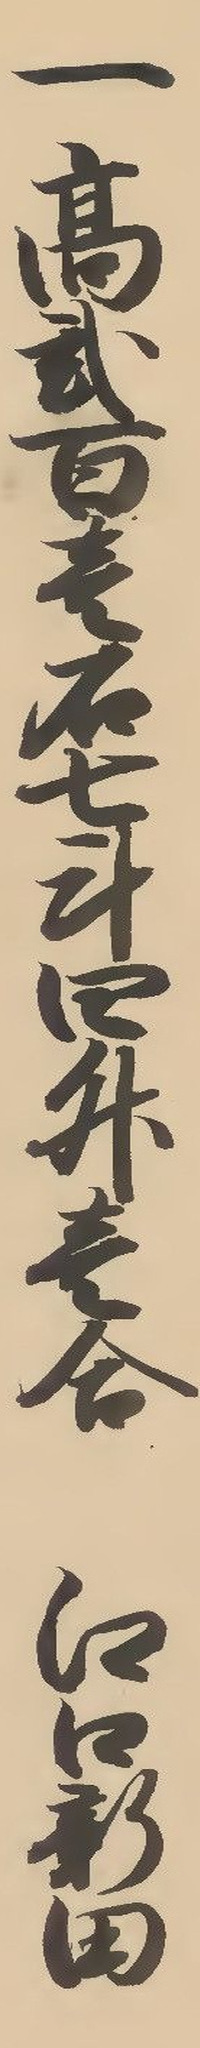一高弐百壱石七斗四升壱合江口新田

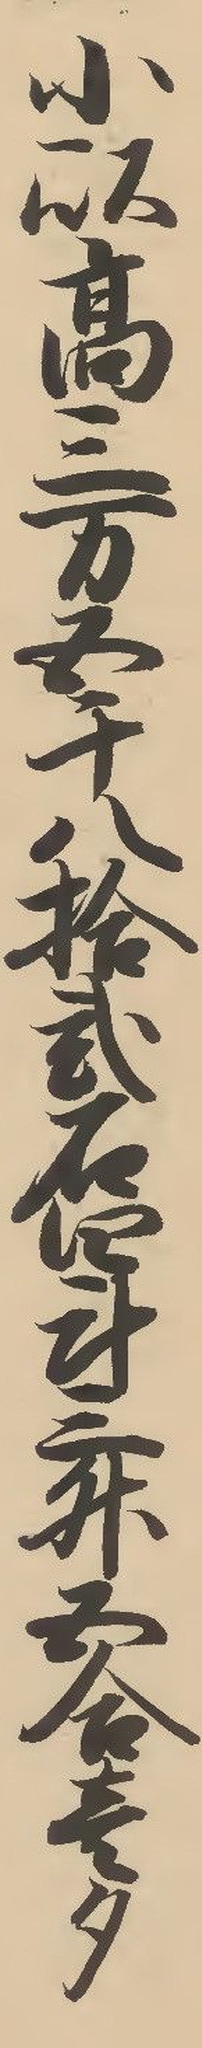小以高三万五千八拾弐石四斗三升五合壱勺
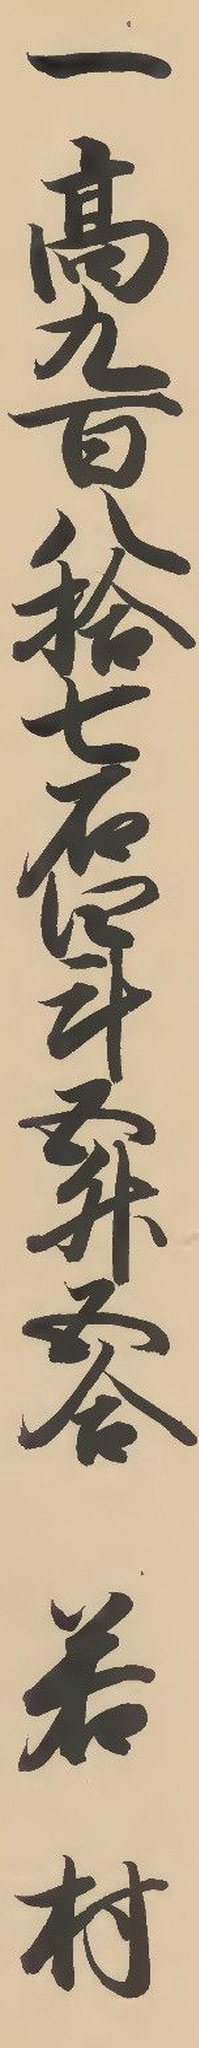一高九百八拾七石四斗五升五合若村
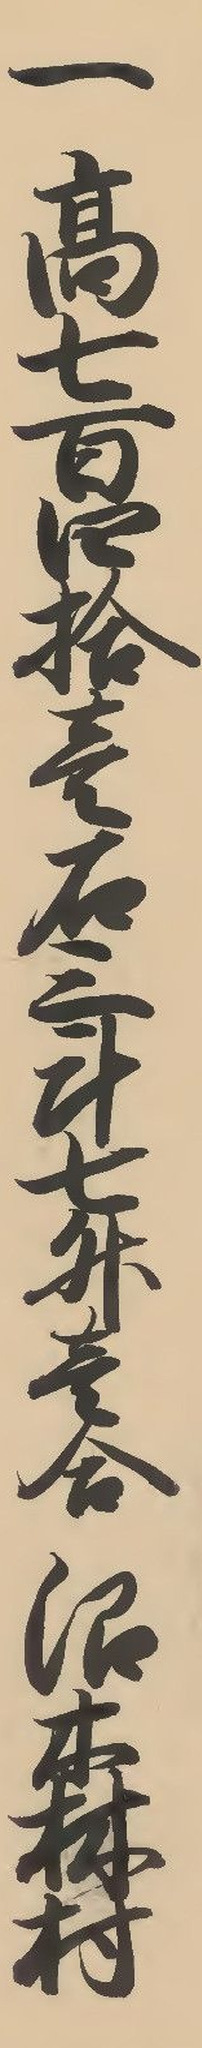一高七百四拾壱石三斗七升壱合沼森村
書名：下総国郷帳
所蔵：国立公文書館 National Archives of Japan
